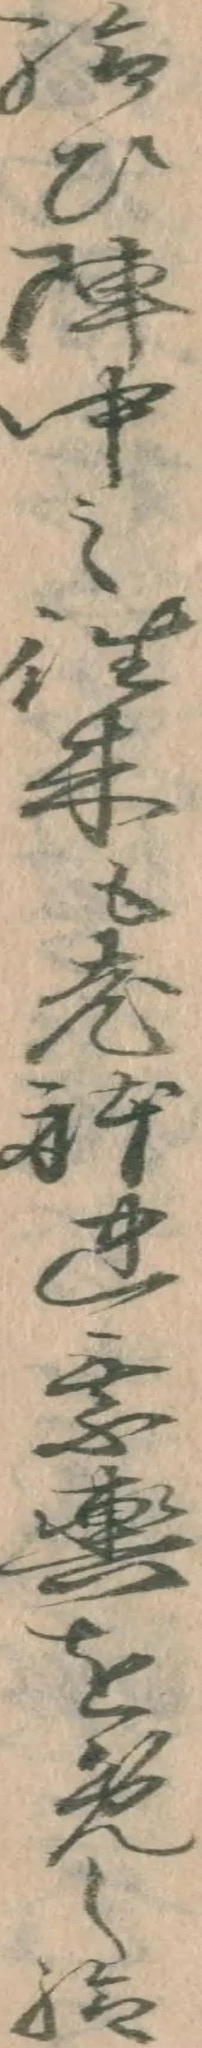給ひ陣中之往来も老躰迚乗輿を免し給
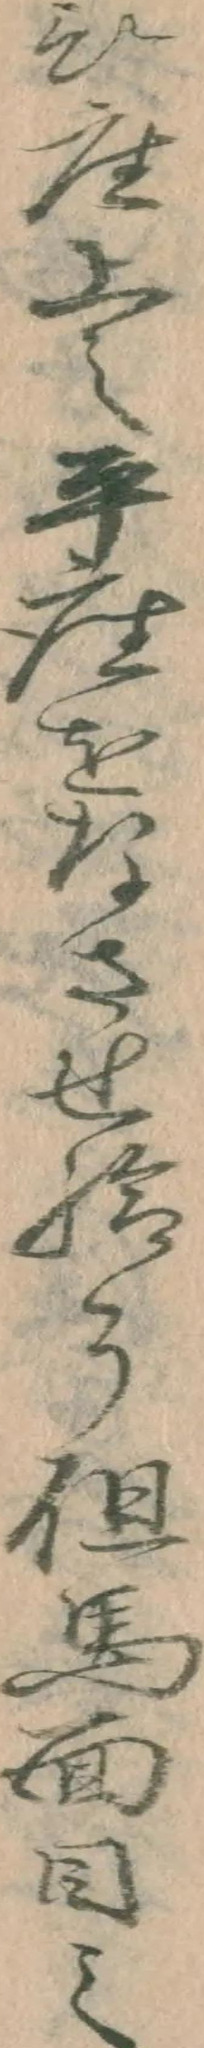ひ座上之平座をなさせ給う但馬面目之
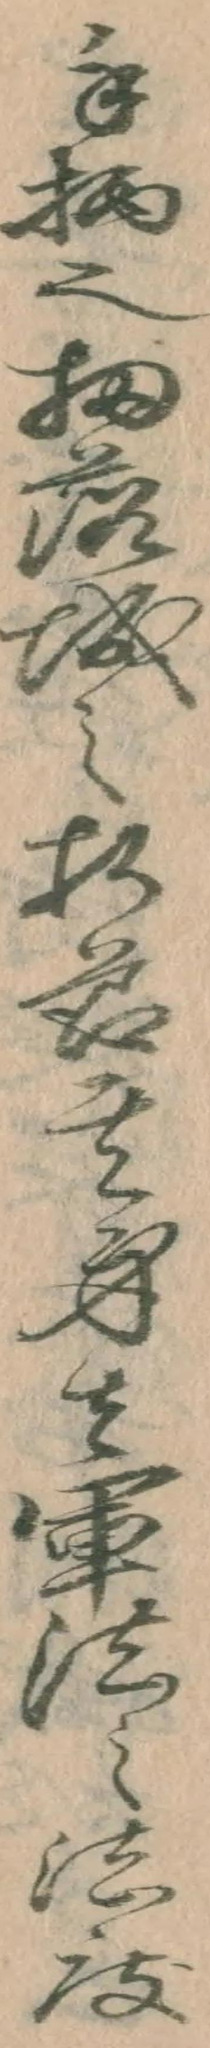手柄也扨落城之折節其身者軍法之法度
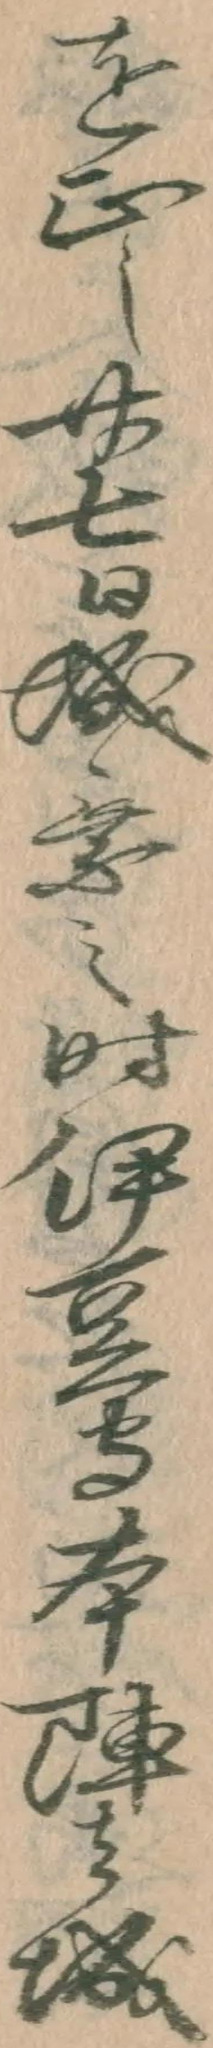を正し廿七日城乗之時伊豆守本陣者城
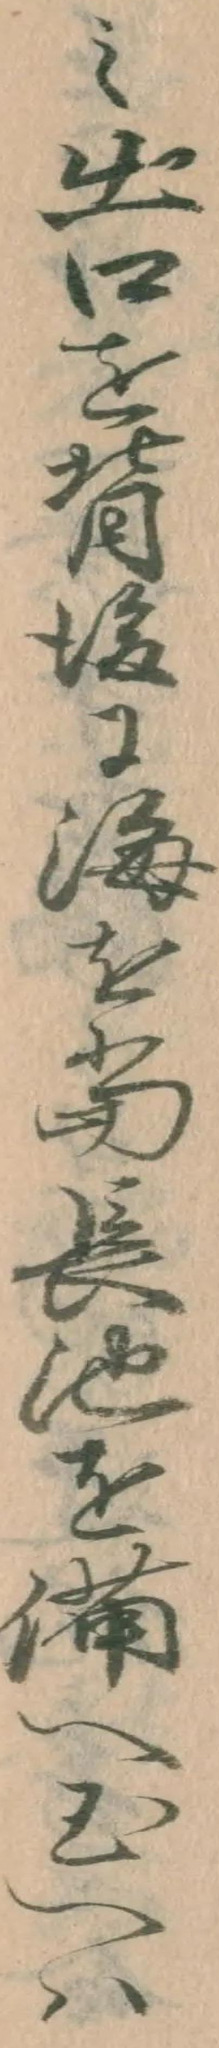之出口を背後尓海を当長池を備へむへは
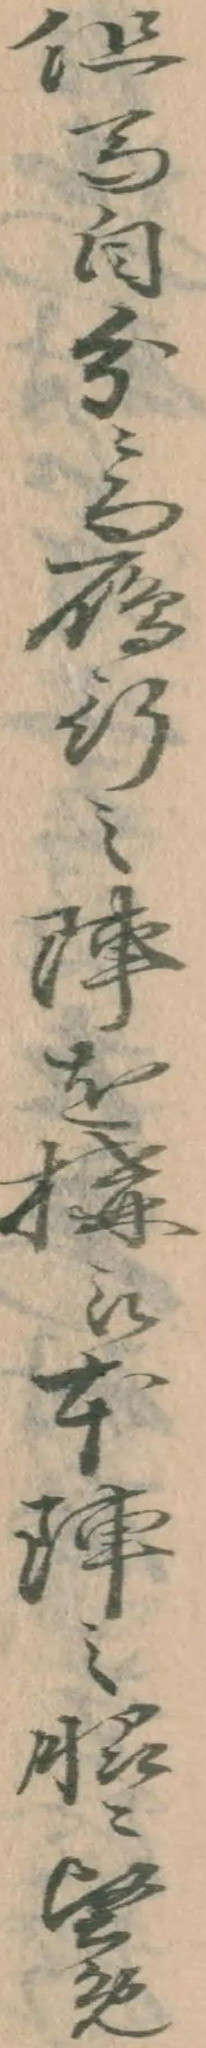但馬自分に而鴈行之陣を構江本陣之脇に堅免
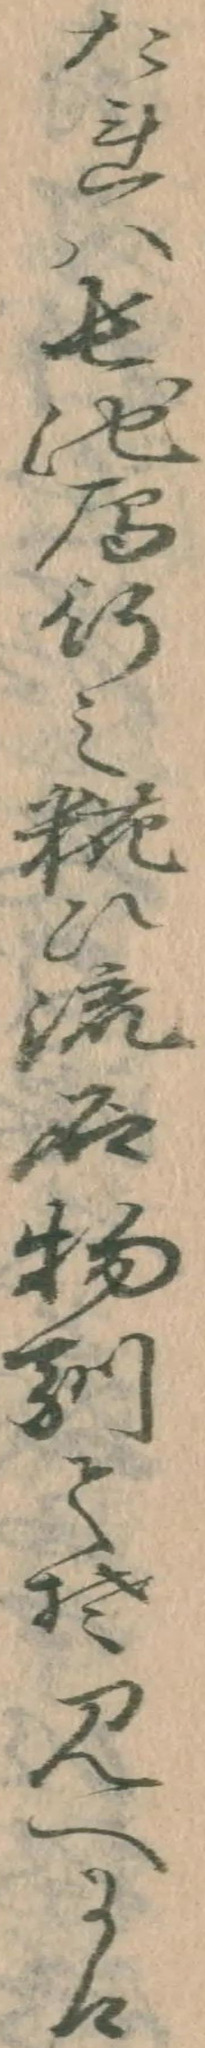た連は長池鴈行之糀ひ流石物馴て楚見へ尓け
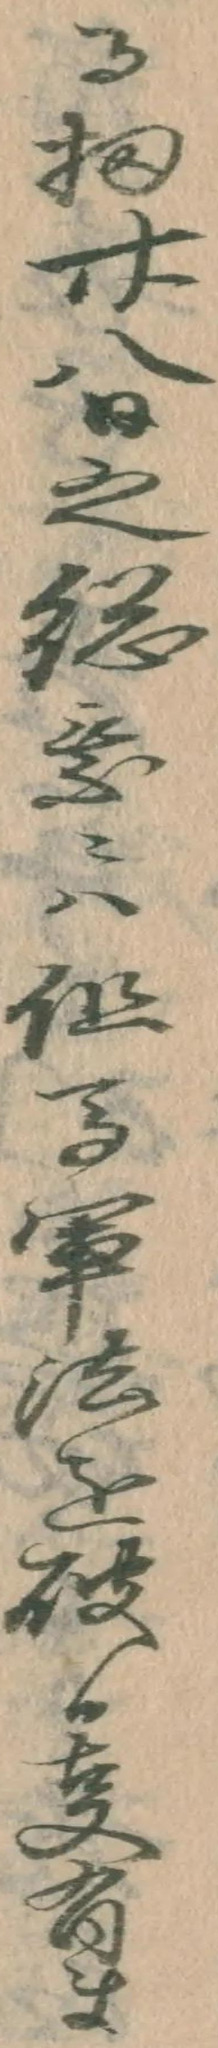る扨廿八日之総乗には但馬ぐ軍法を破る事有ま
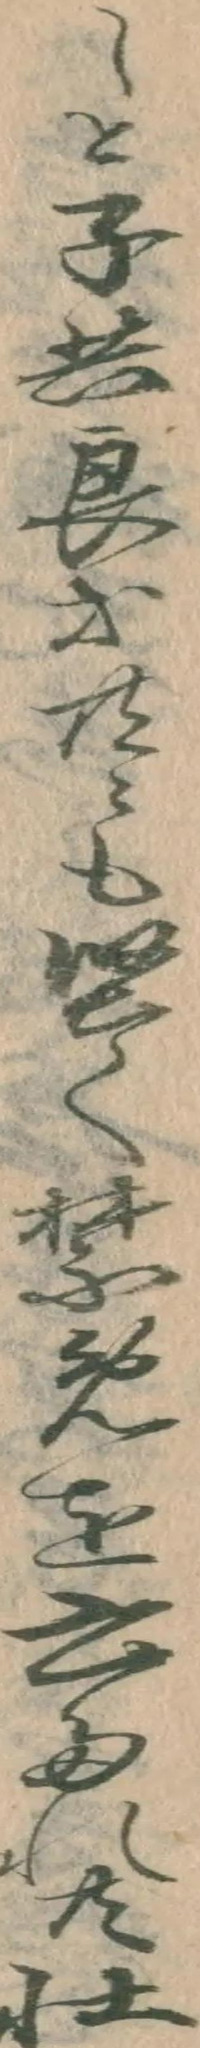しと子共良等共にも堅く禁免を云多れ共壮
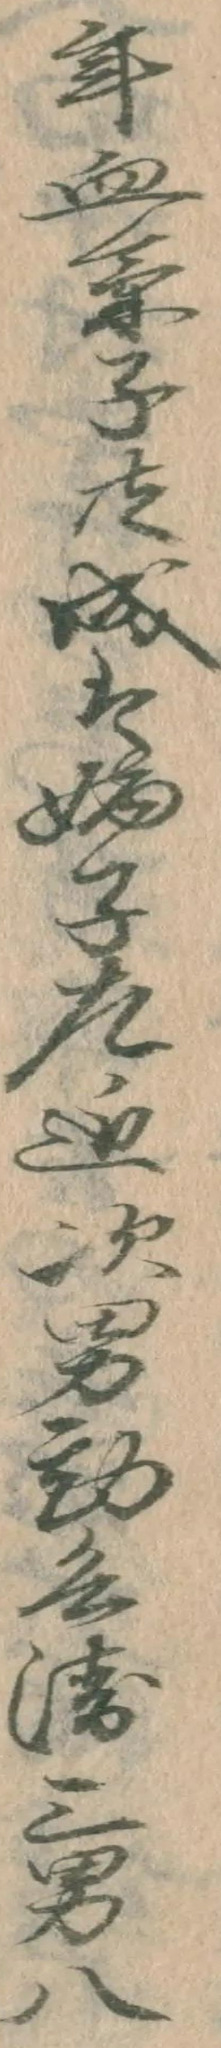年血気子共成盤嫡子左近次男勘兵衛三男八
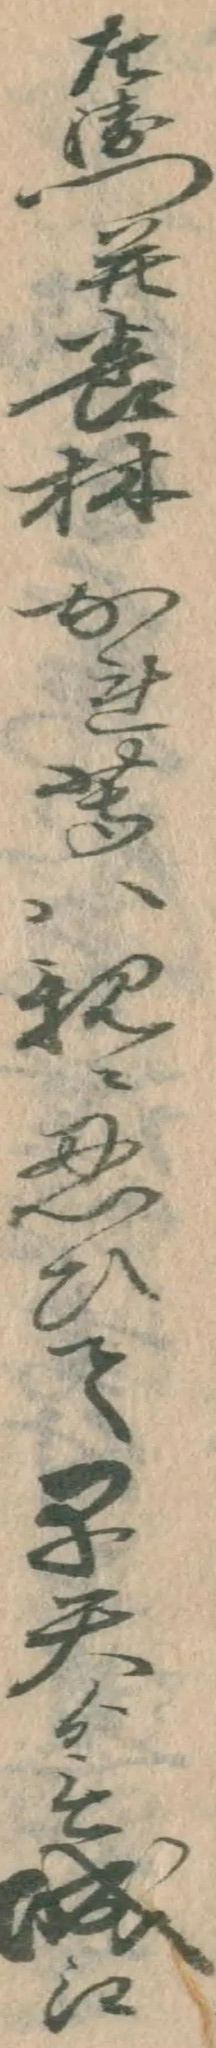左衛門幷養林加連等は親に忍ひて早天ゟも城江
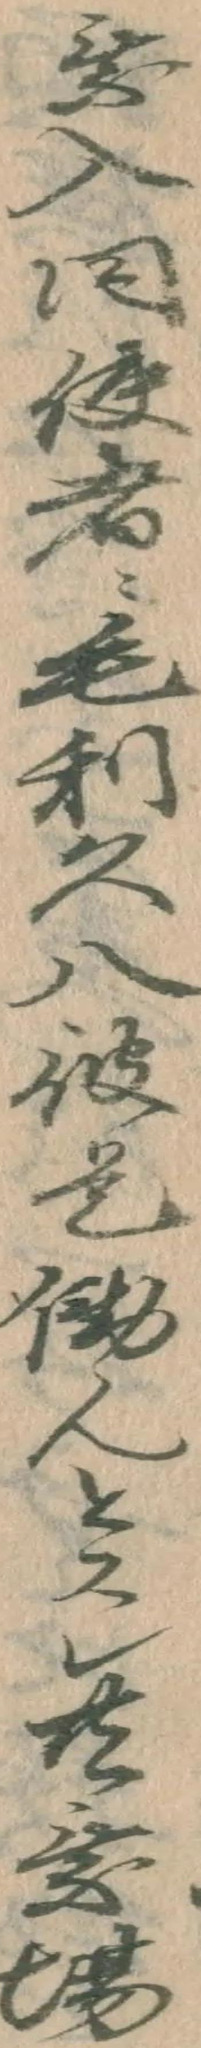乗入り同使者に毛利久八彼是働人とすれ共乗場
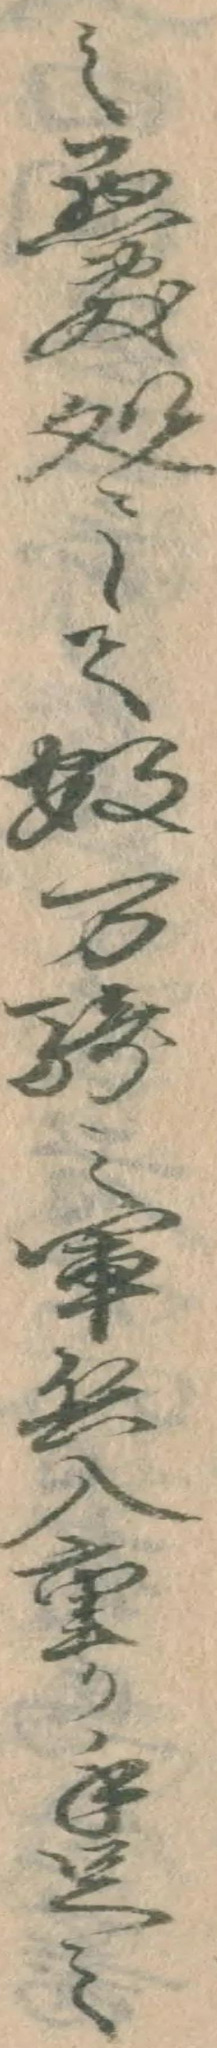之悪敷処にして数万騎之軍兵入重り手足之
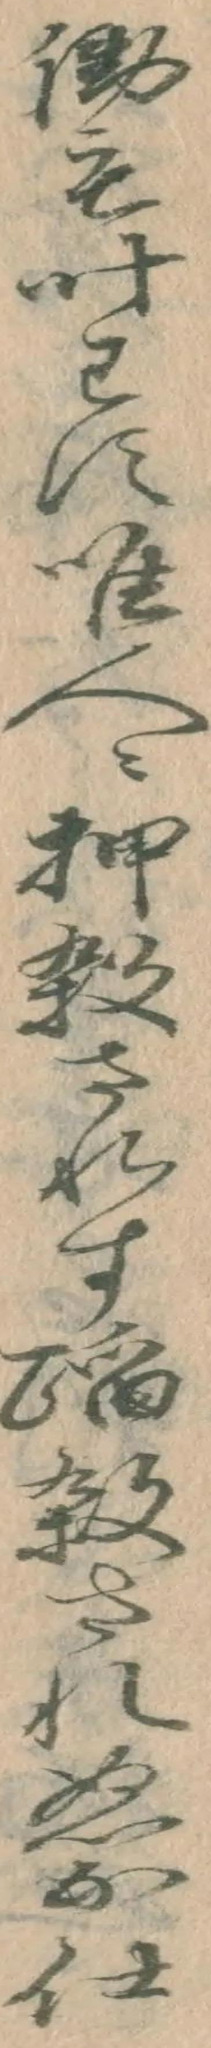働も叶已須唯人に押殺されす踏殺され怒か仕
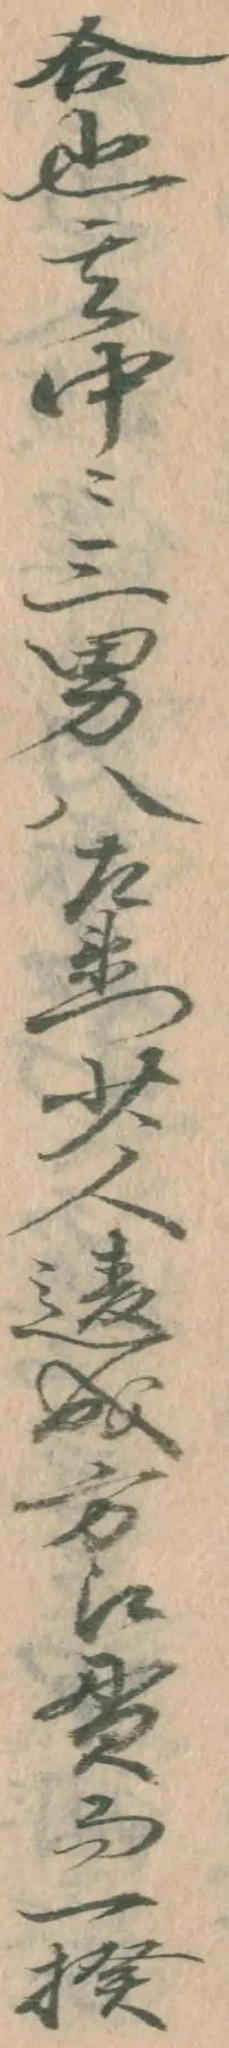合也其中に三男八左衛門少人違成方江貫而一揆

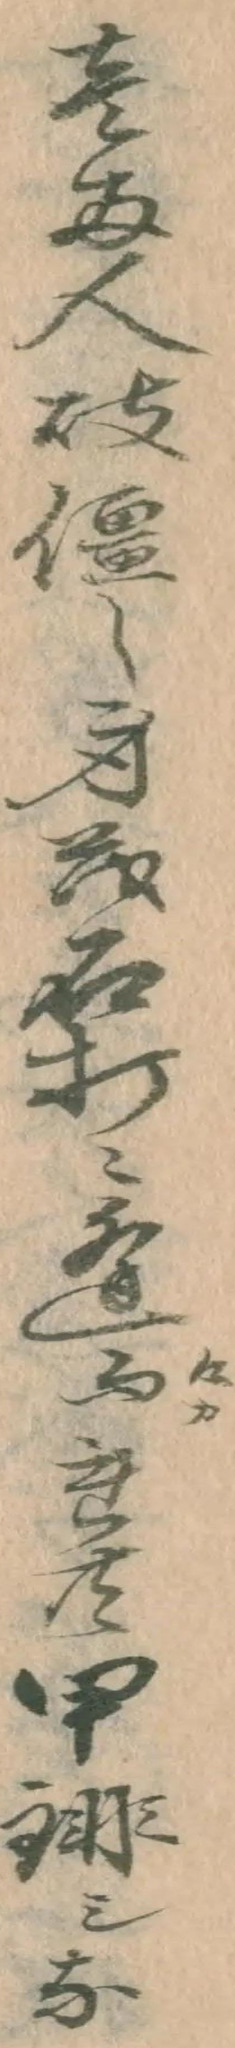壱両人破僵し身茂石打に逢而連共甲銚しな
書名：切支丹御退治記 49巻. [8]
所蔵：国立国会図書館 National Diet Library, JAPAN
